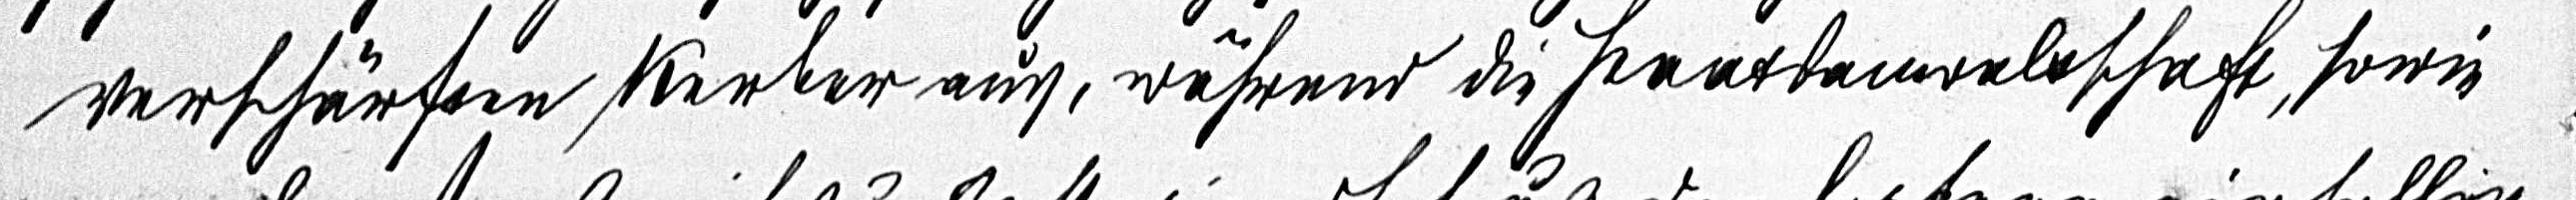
verschärften Kerker aus, während die Staatsanwaltschaft, sowie
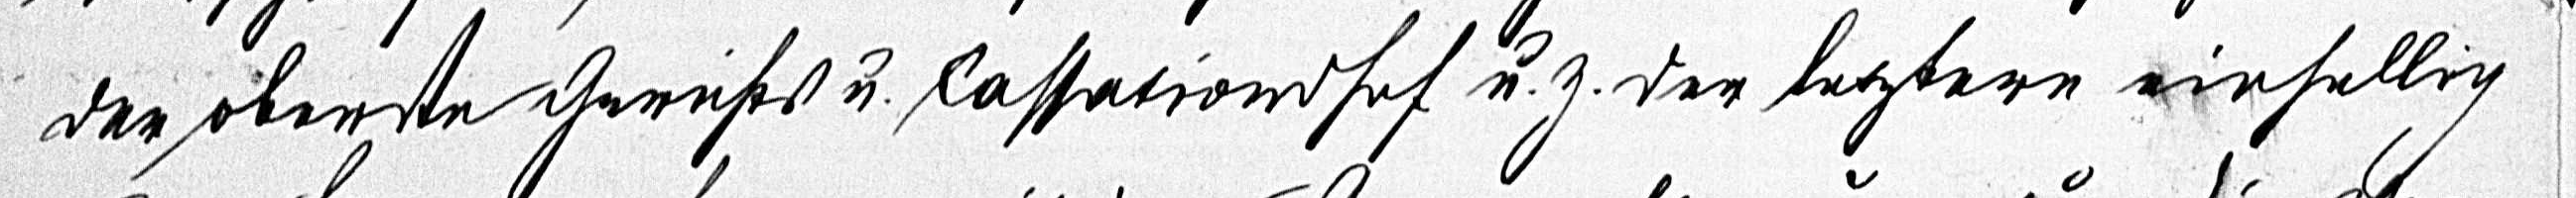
der oberste Gerichts- u. Cassationshof u.z. der letztere einhellig
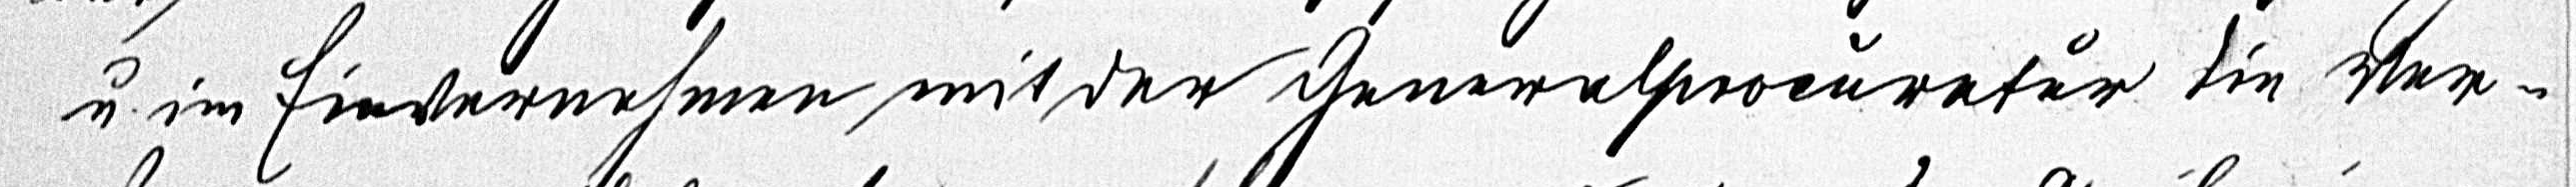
u. im Einvernehmen mit der Generalprocuratur die Ver¬
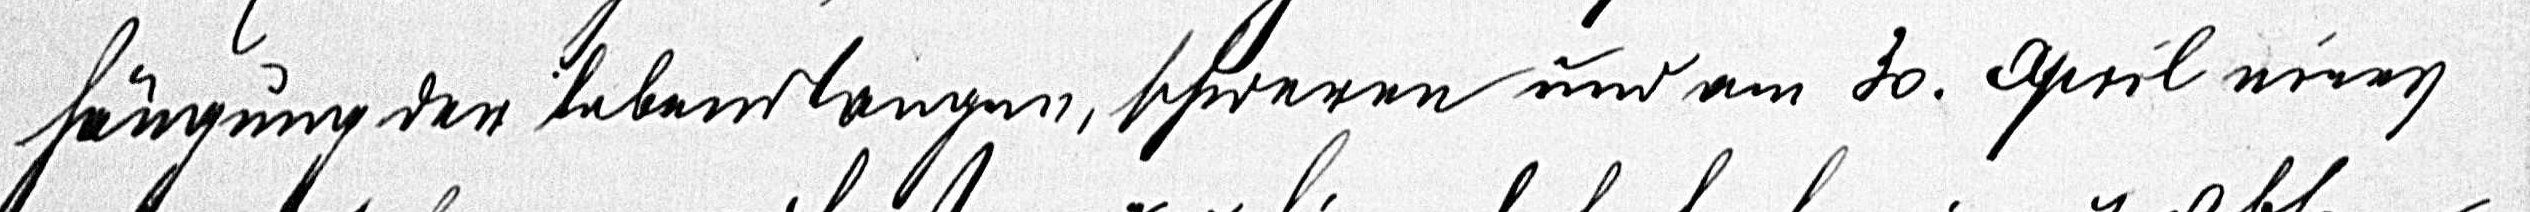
hängung den lebenslangen, schweren und am 30. April eines
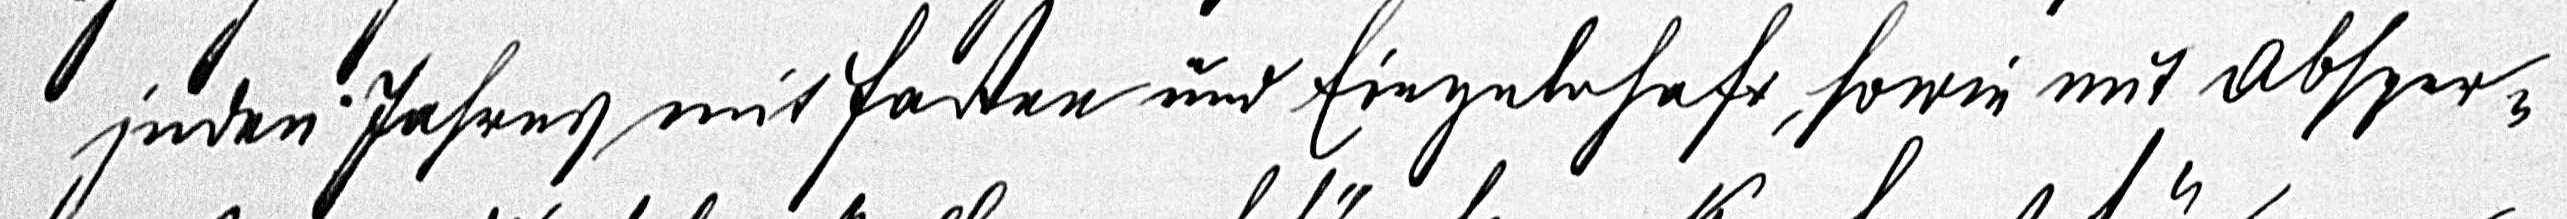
jeden Jahres mit Fasten und Einzelnhaft, sowie mit Absper¬
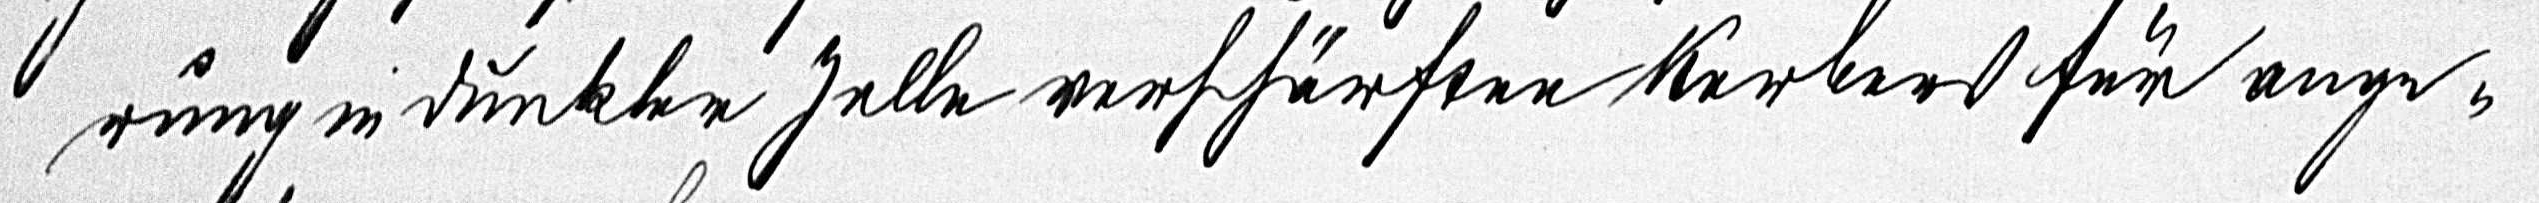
rung in dunkler Zelle verschärften Kerker für ange¬
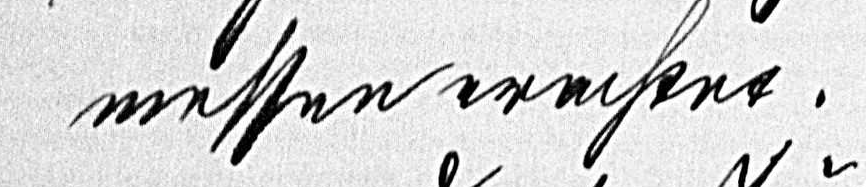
messen erachtet.
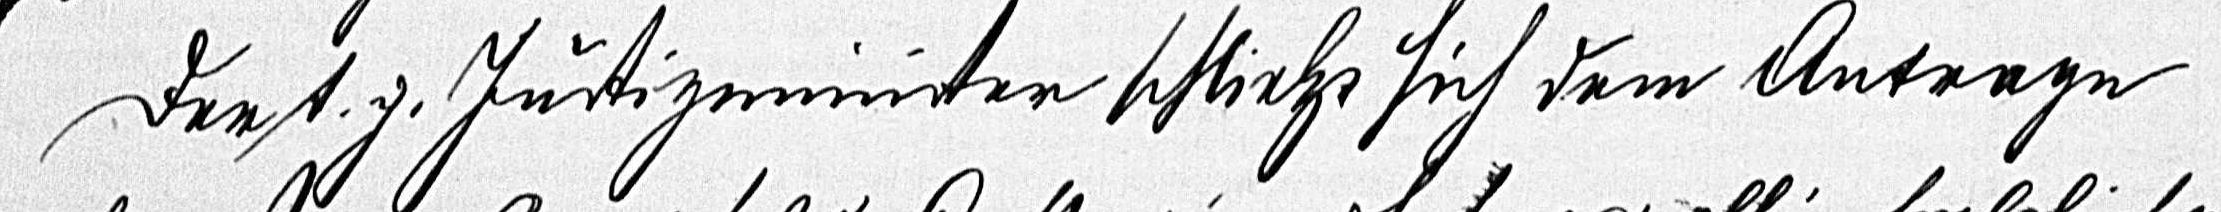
Der A. g. Justizminister schließt sich dem Antrage
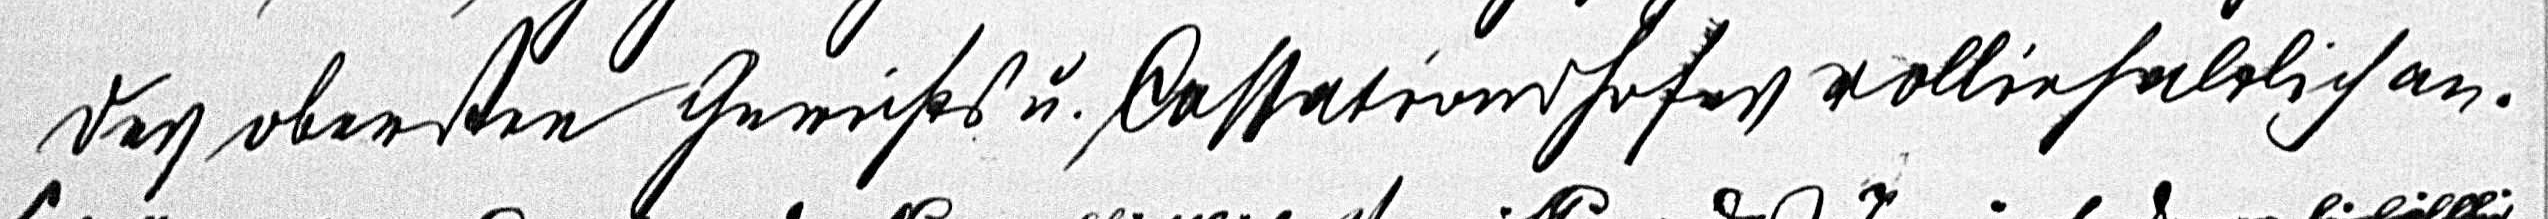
des obersten Gerichts- u. Cassationshofes vollinhaltlich an.
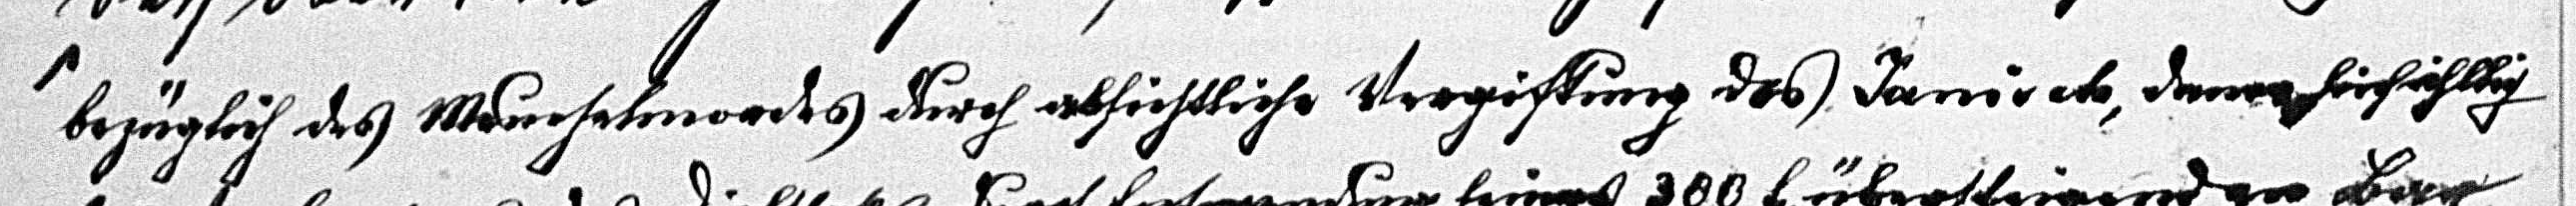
bezüglich des Meuchelmordes durch absichtliche Vergiftung des Janisch denn hinsichtlich
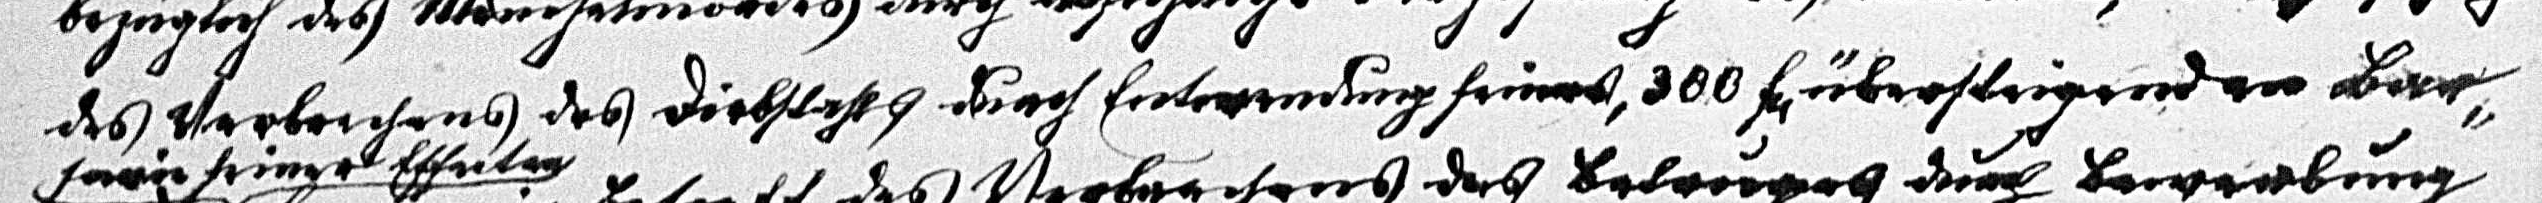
des Verbrechens des Diebstahls durch Entwendung seines, 300 f übersteigendes Bar¬
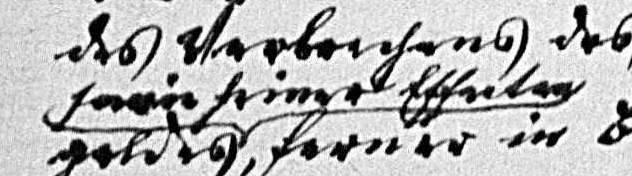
sowie seiner Effecten,
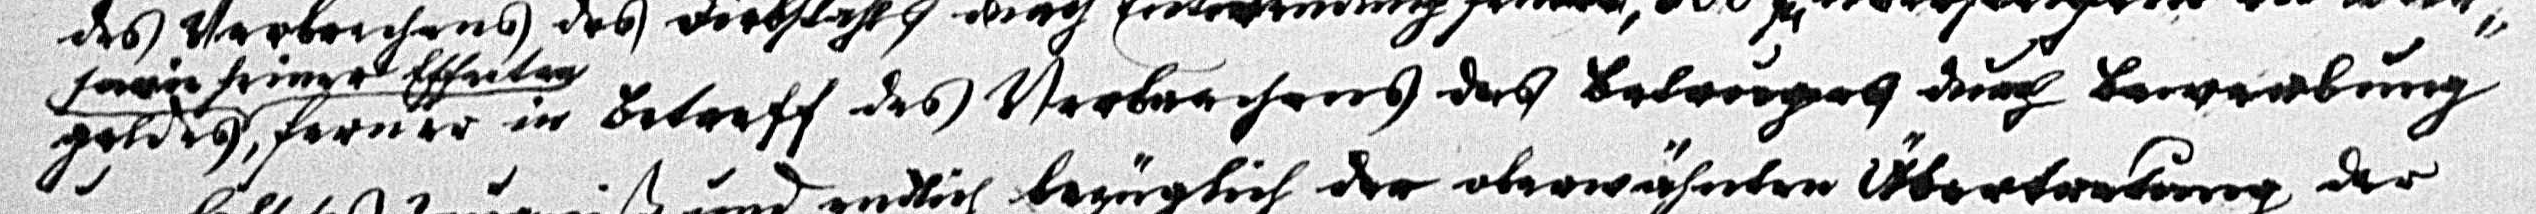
geldes, ferner in Betreff des Verbrechens des Betruges durch Bewerbung
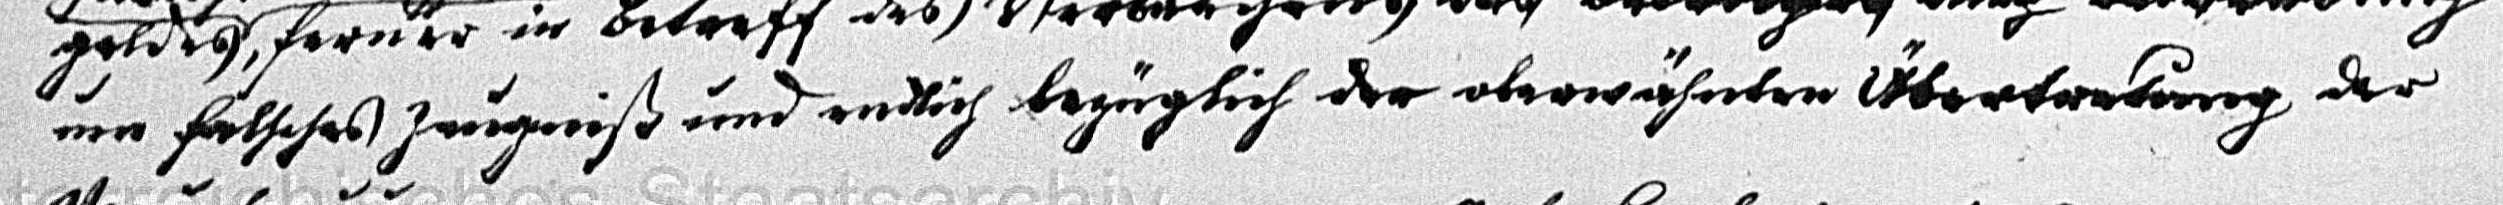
um falsches Zeugniß und endlich bezügich der oberwähnten Übertretung der
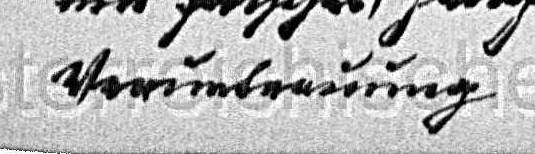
Veruntreuung
